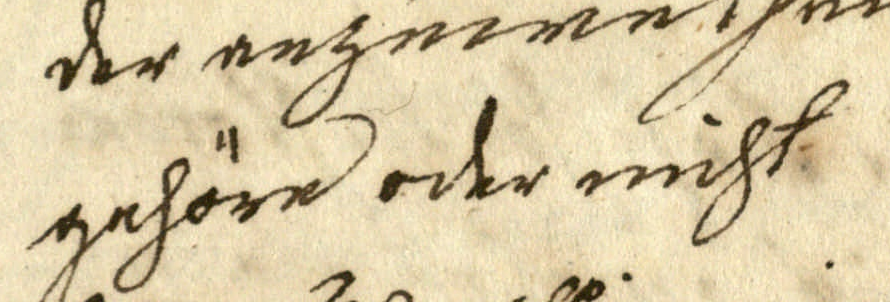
gehöre oder nicht
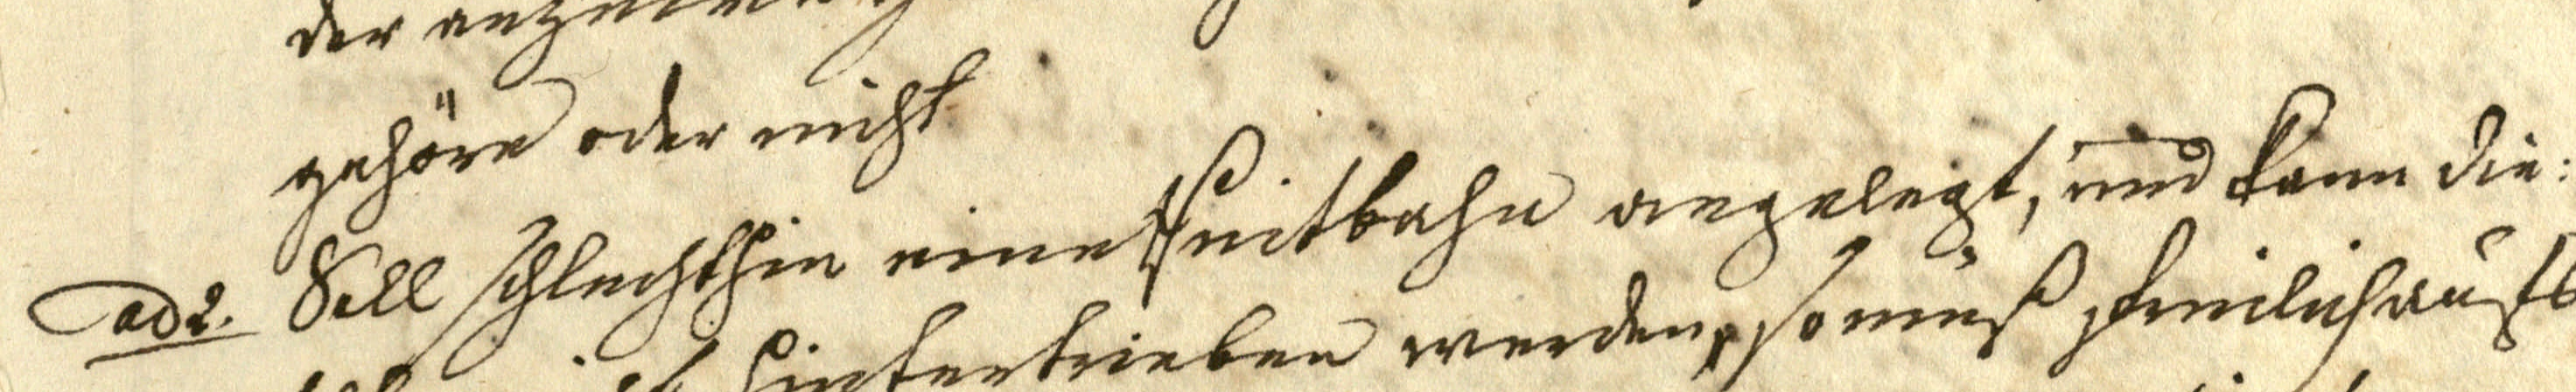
ad 2. Soll schlechthin eine Reitbahn angelegt, und kann die¬
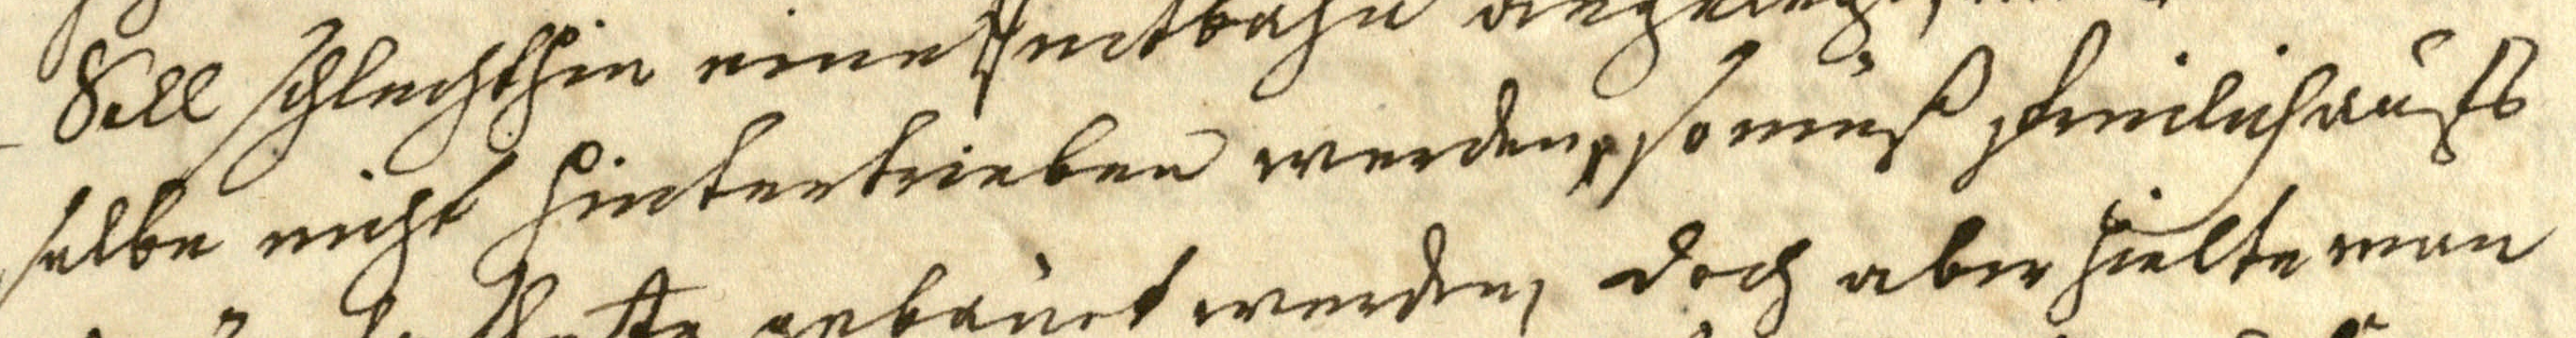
selbe nicht hintertrieben werden, so muß freilich aufs
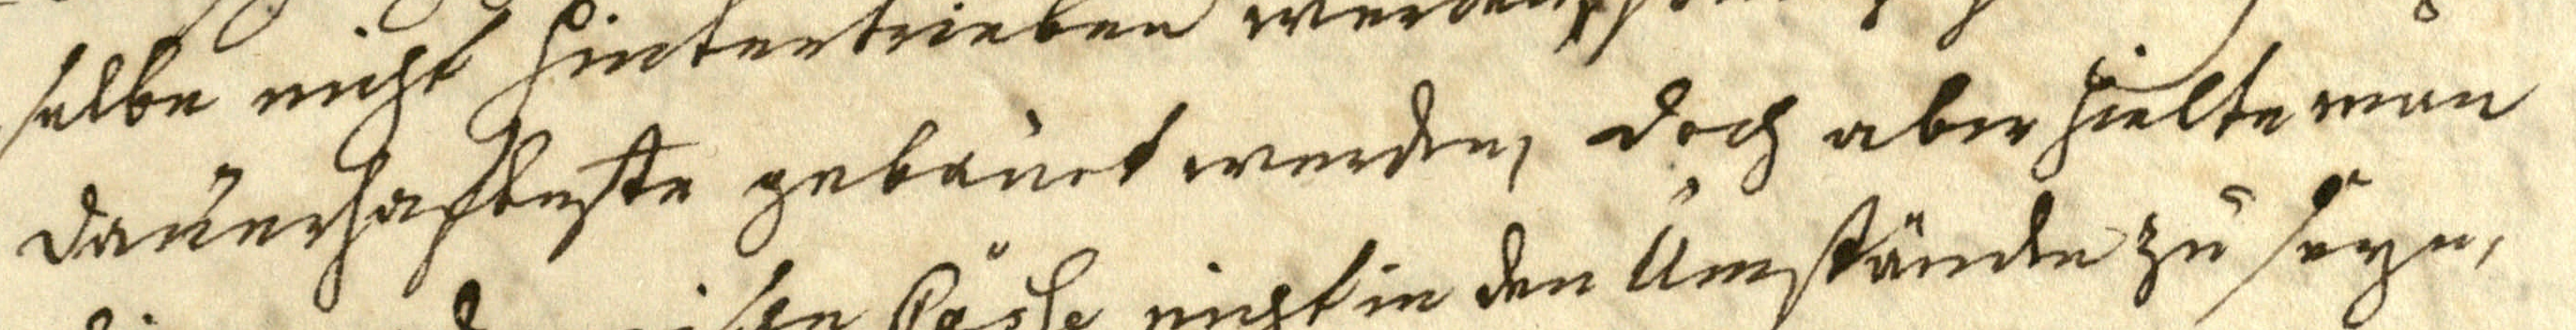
dauerhafteste gebauet werden, doch aber hielte man
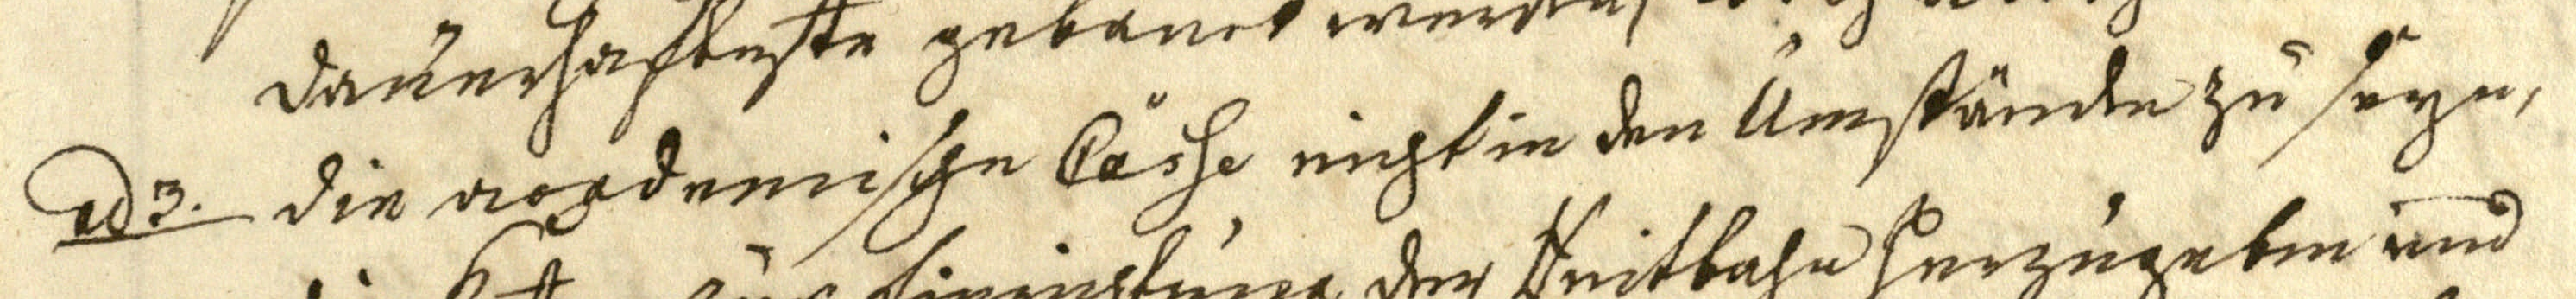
ad 3. die academische Casse nicht in den Umständen zu seÿn,
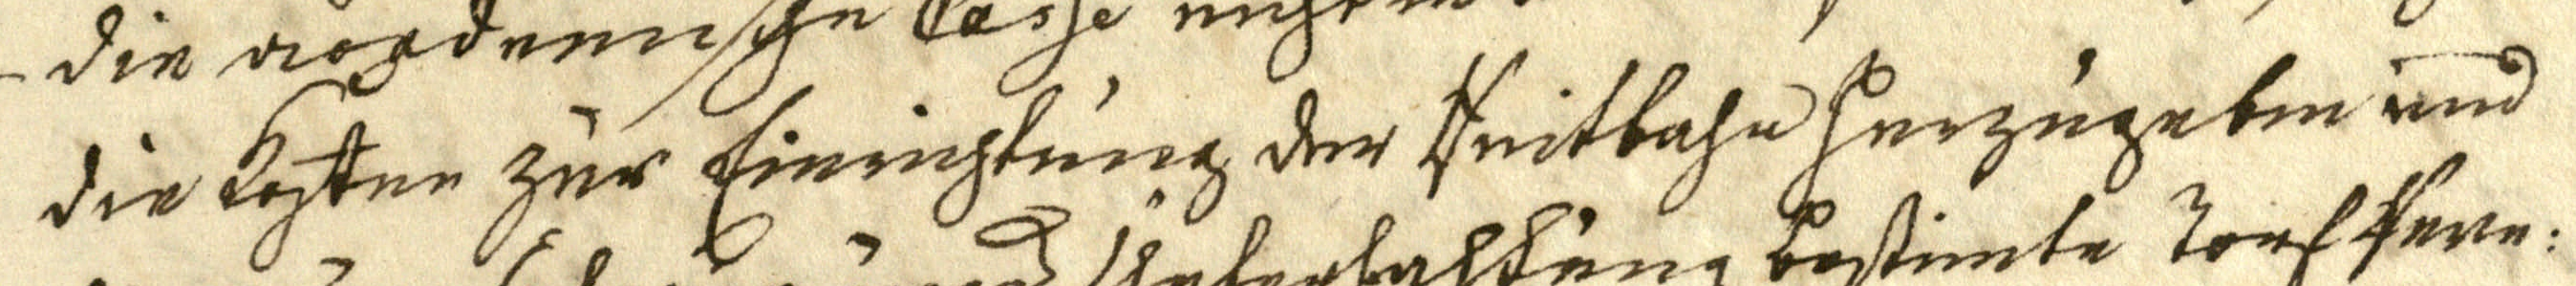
die Kosten zur Einrichtung der Reitbahn herzugeben und
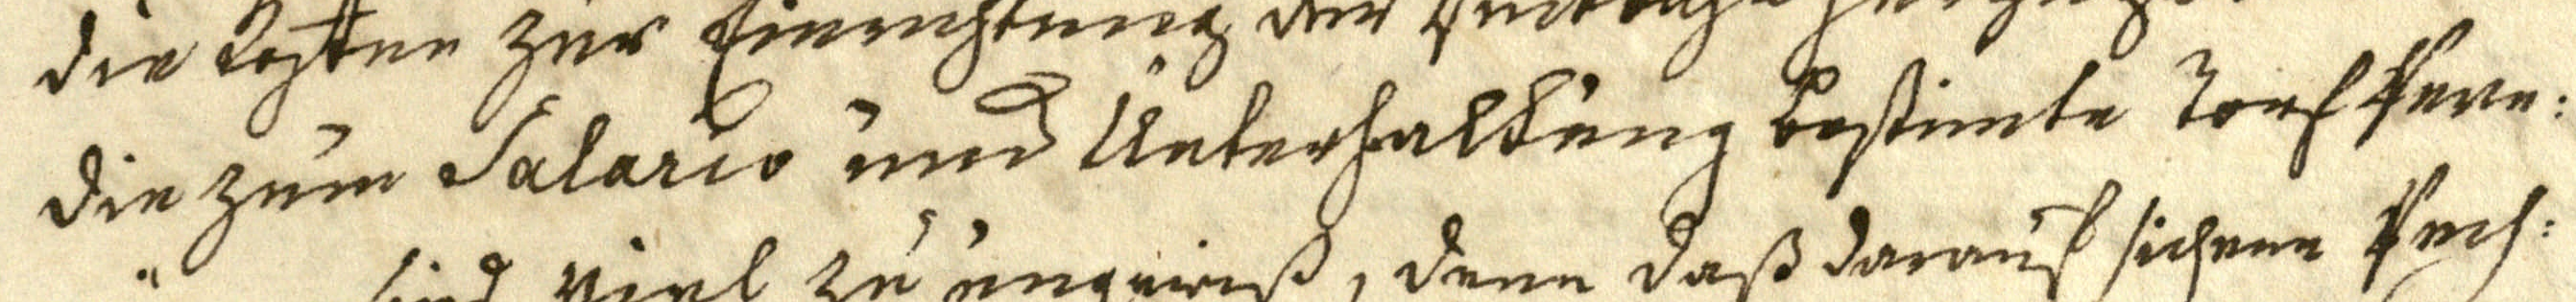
die zum Salario und Unterhaltung bestimmte Torf Reve¬
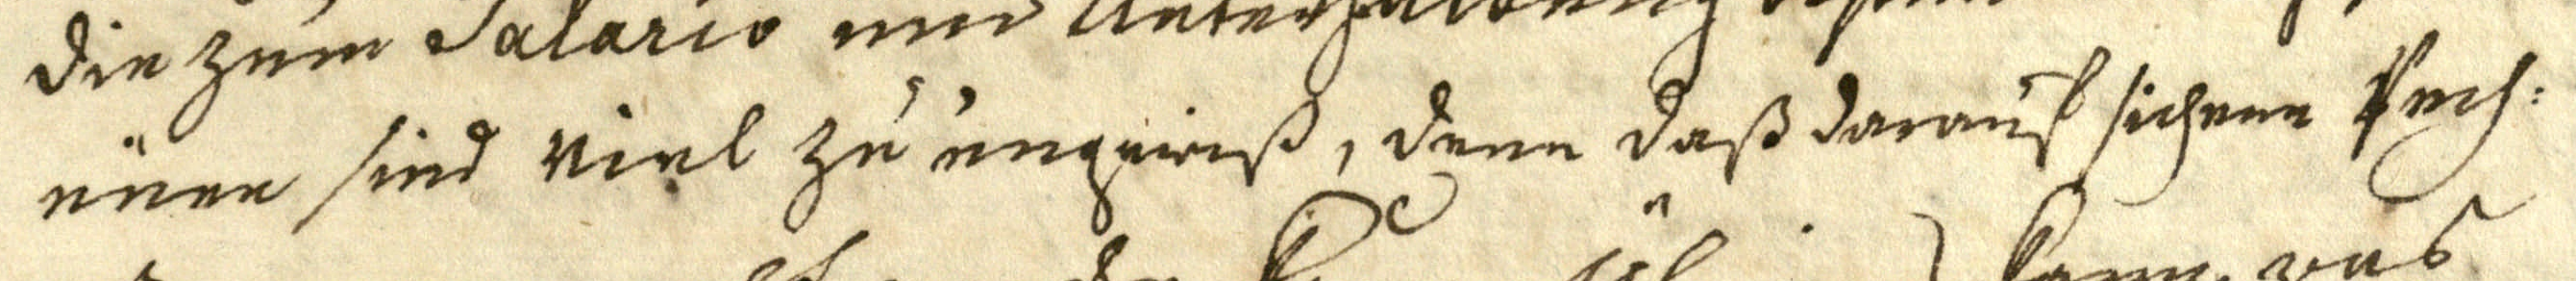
nuen sind viel zu ungewiß, denn daß darauf sichere Rech¬
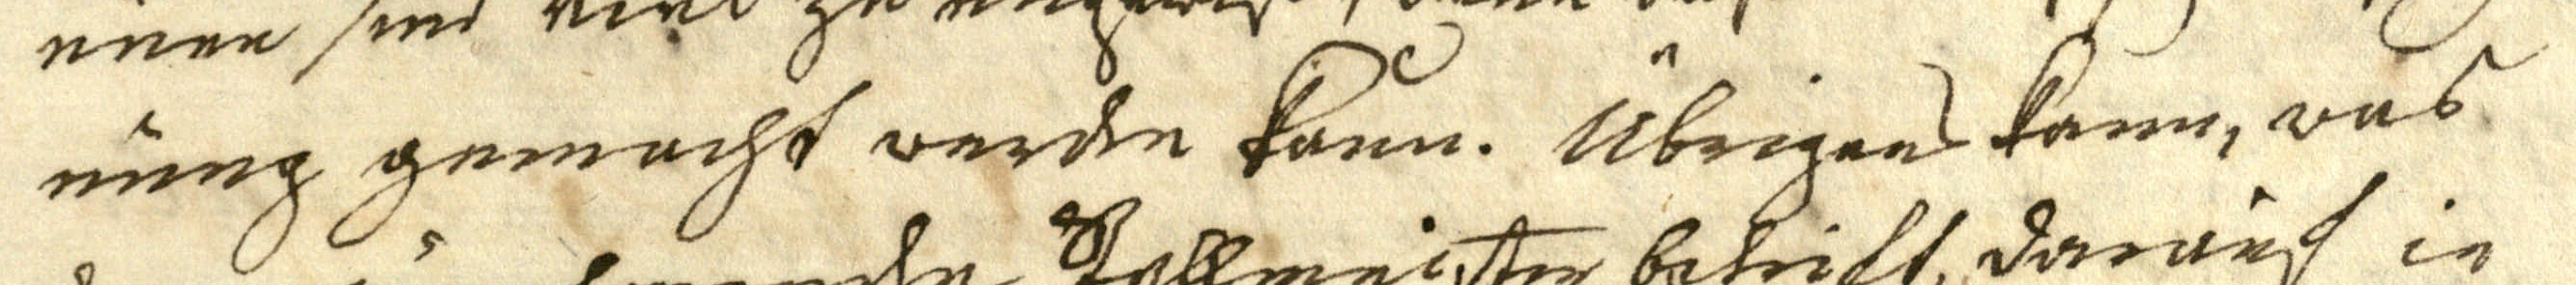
nung gemacht werden kann. Übrigens kann, was
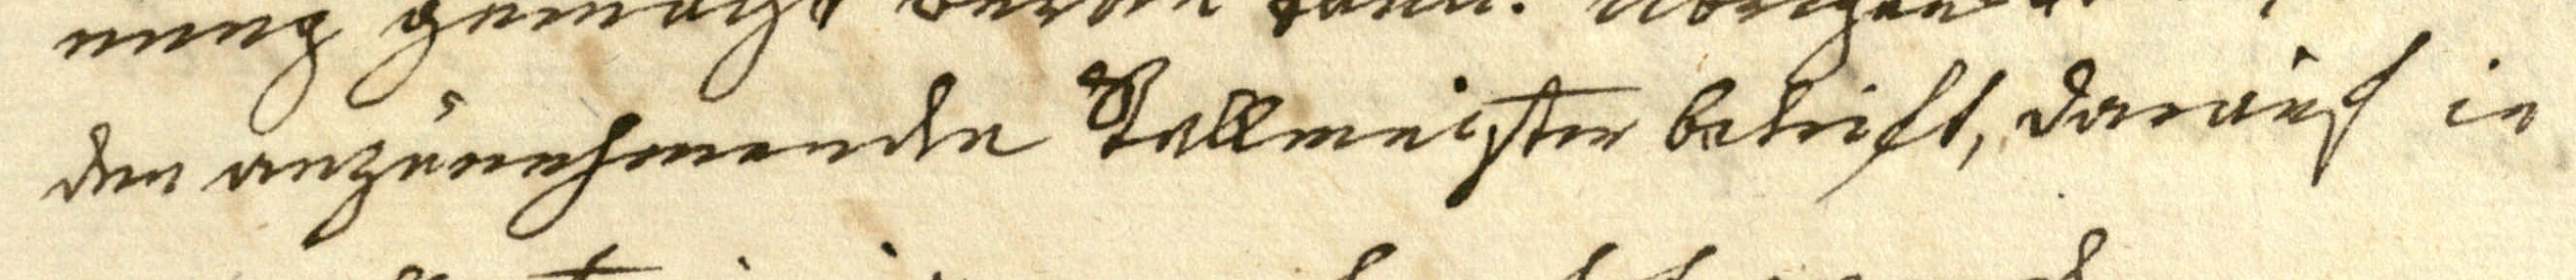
den anzunehmenden Stallmeister betrift, darauf in
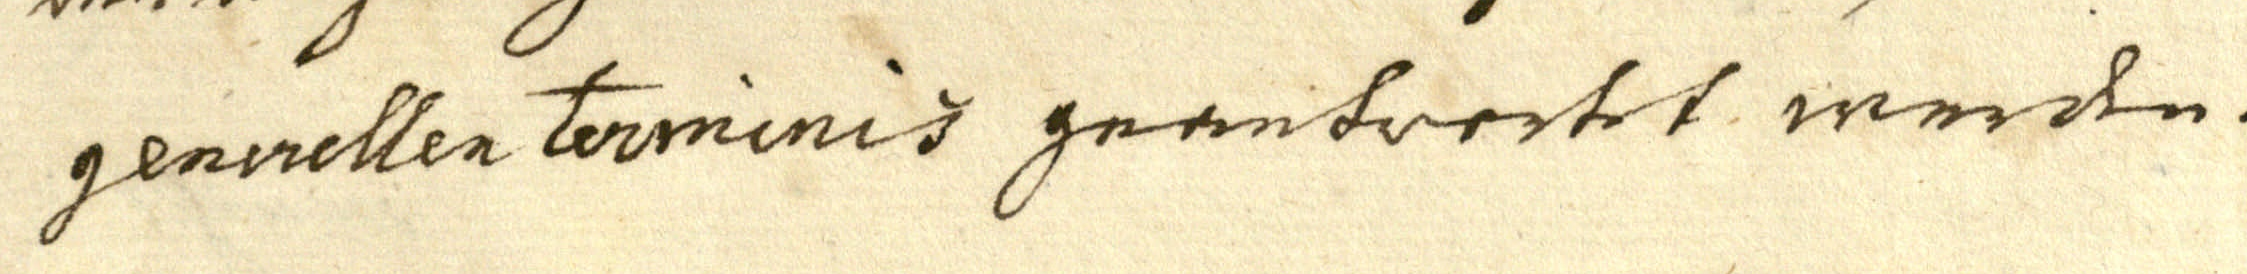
generellen Terminis geantwortet werden.
